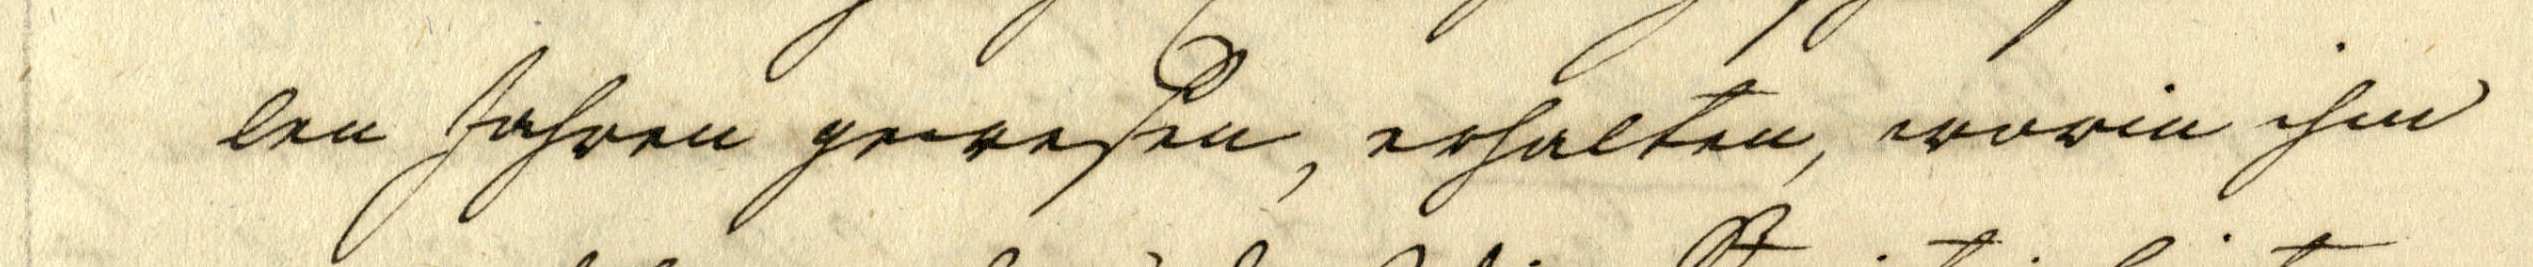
len Jahren gewesen, erhalten, worin ihm
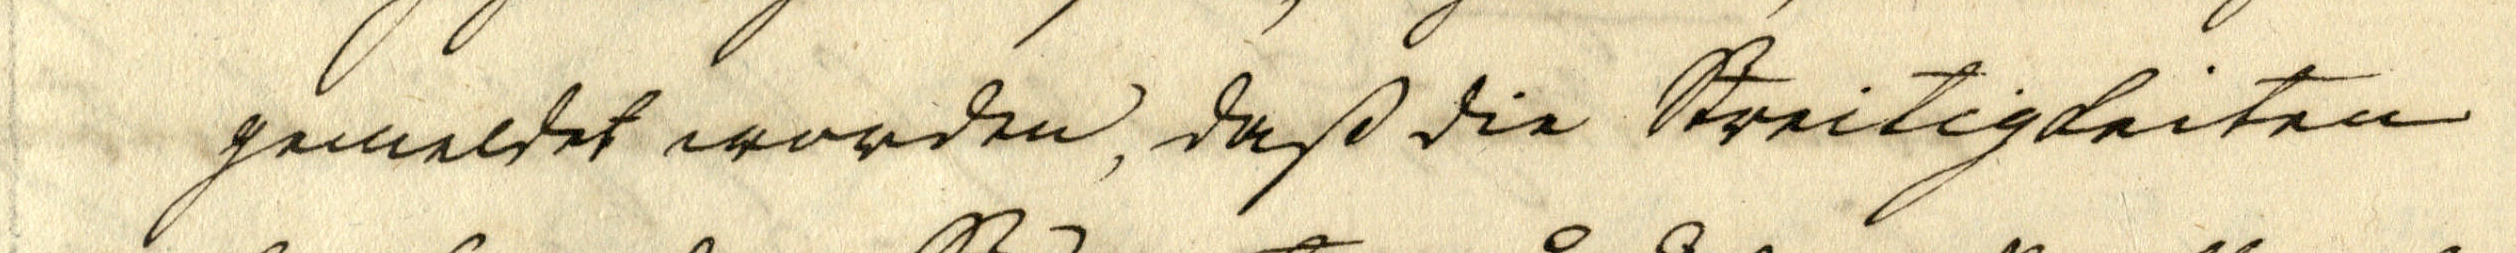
gemeldet worden, daß die Streitigkeiten
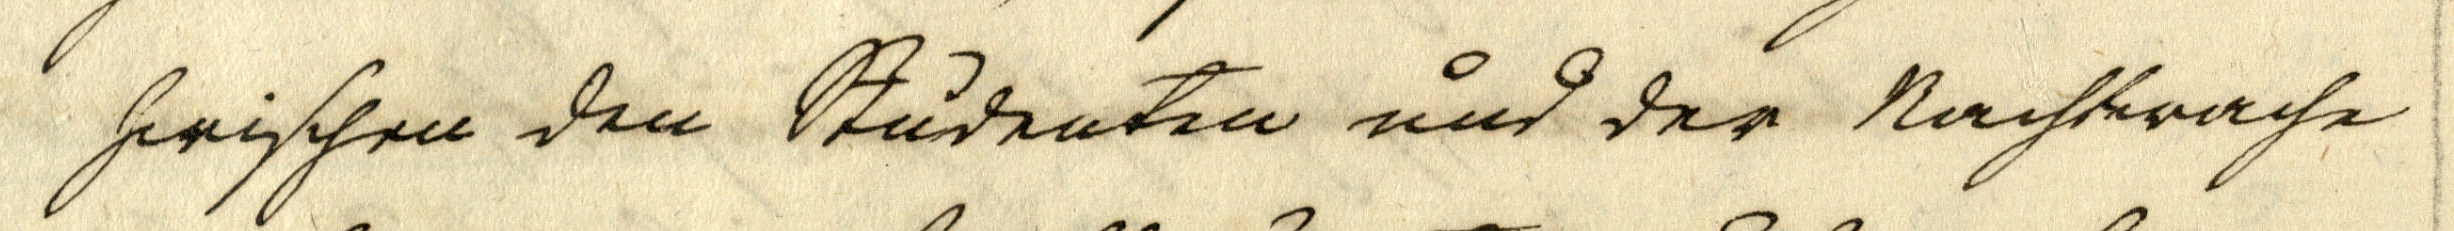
zwischen den Studenten und der Nachtwache
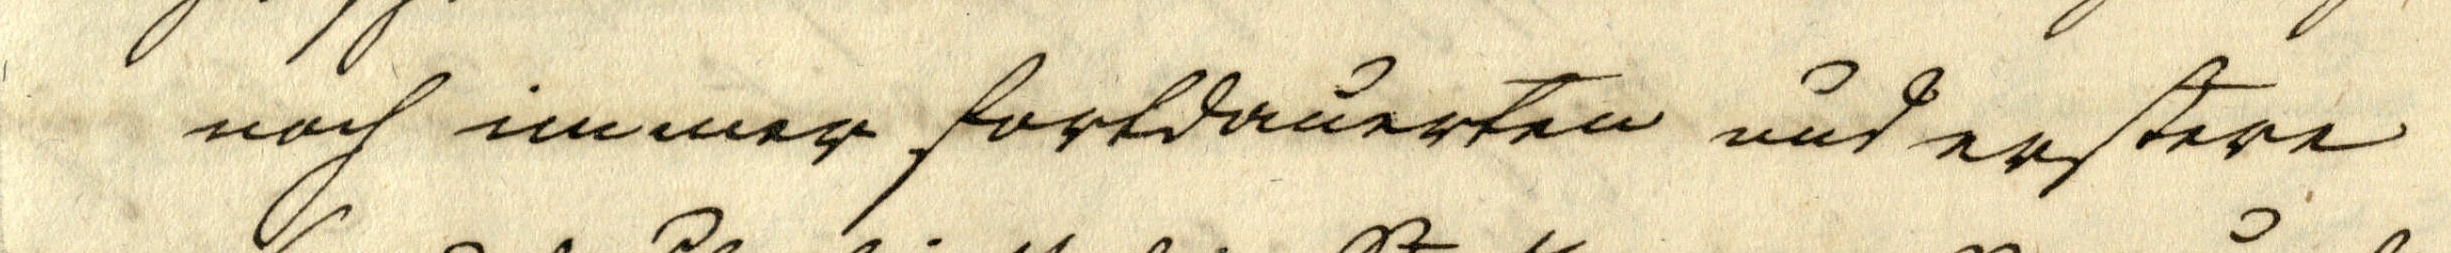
noch immer fortdauerten und erstere
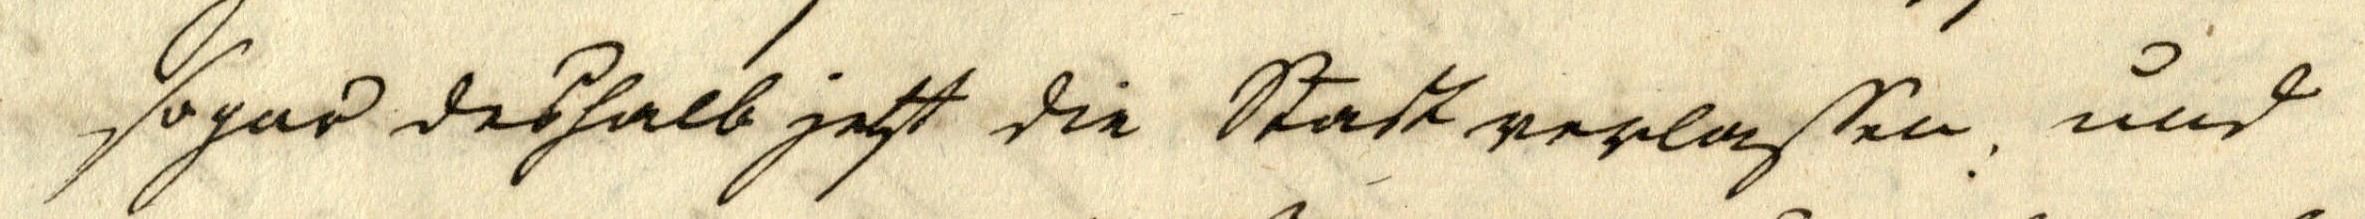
sogar deshalb jetzt die Stadt verlassen und
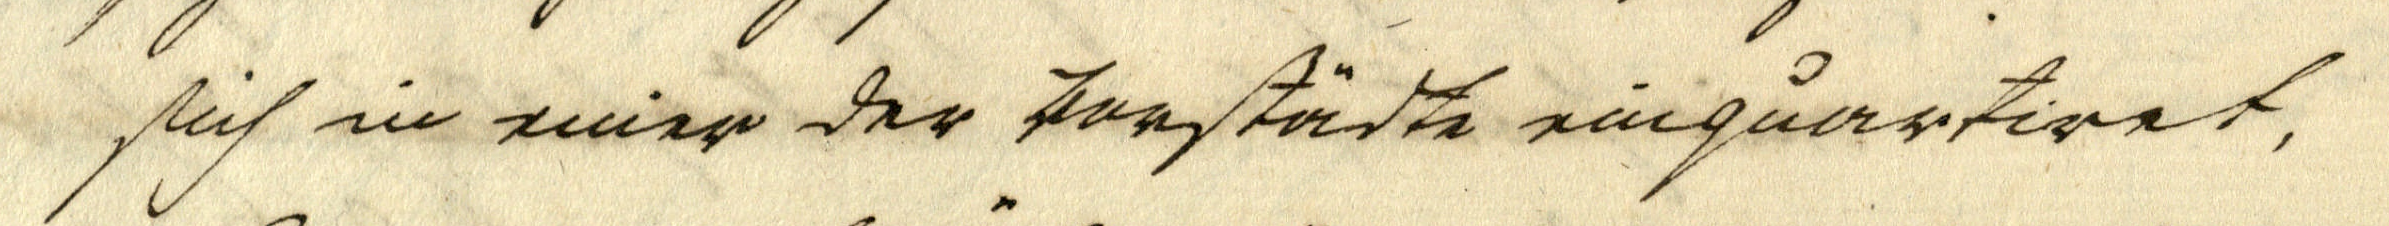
sich in einer der Vorstädte einquartiret,
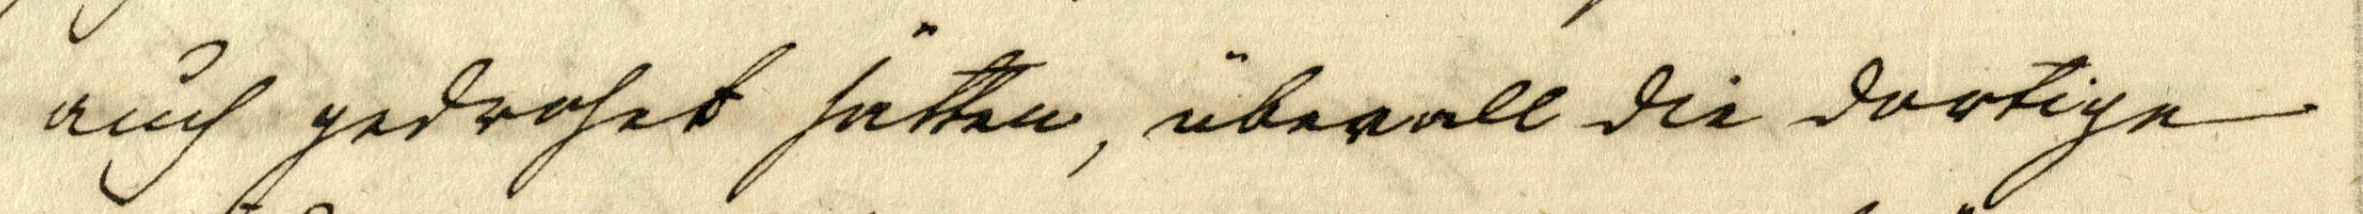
auch gedrohet hätten, überall die dortige
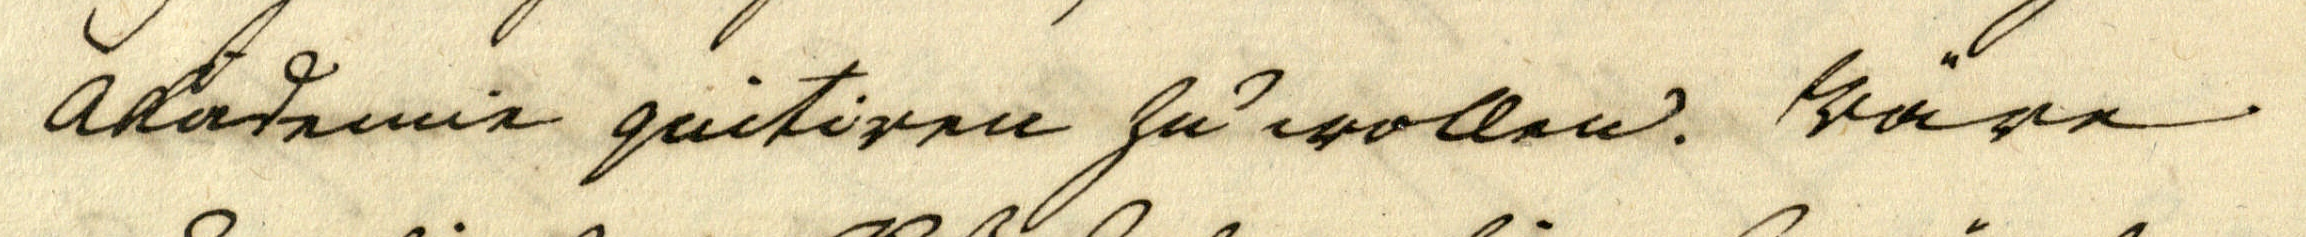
Akademie quitiren zu wollen. Wäre
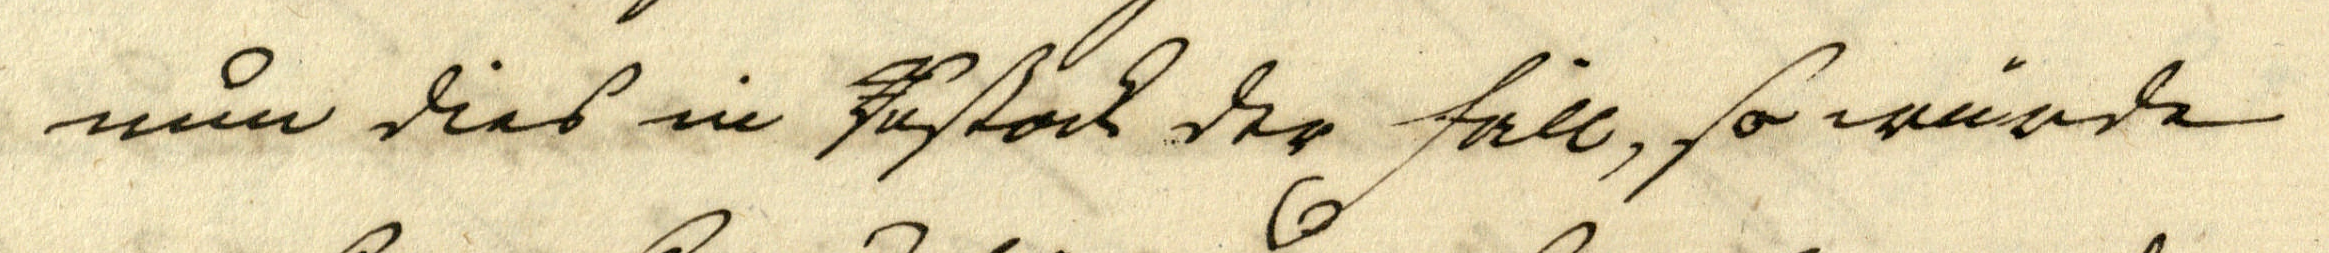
nun dies in Rostock der Fall, so würde
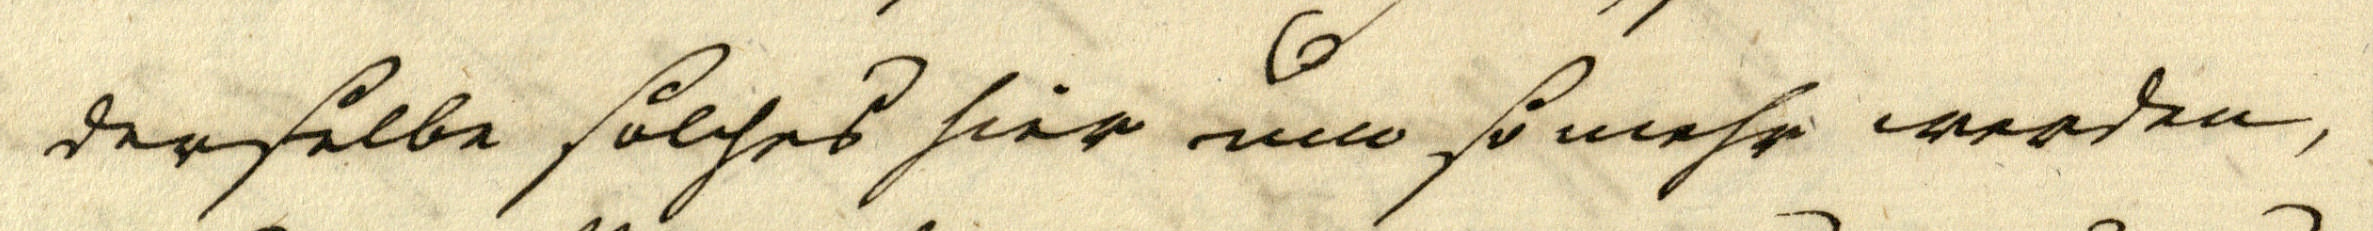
derselbe solches hier um so mehr werden,
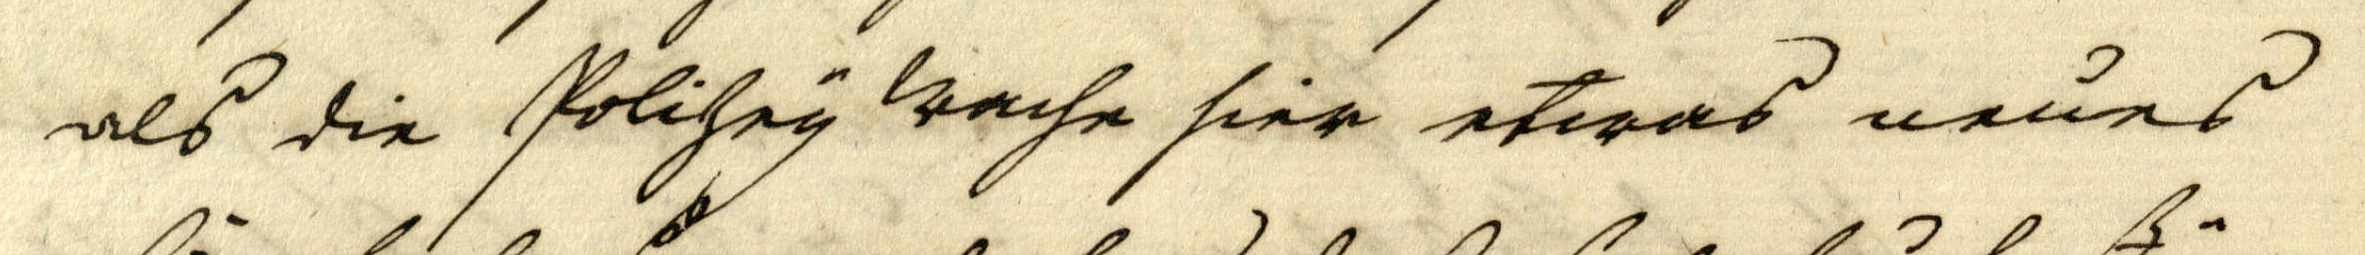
als die Polizey Wache hier etwas neues
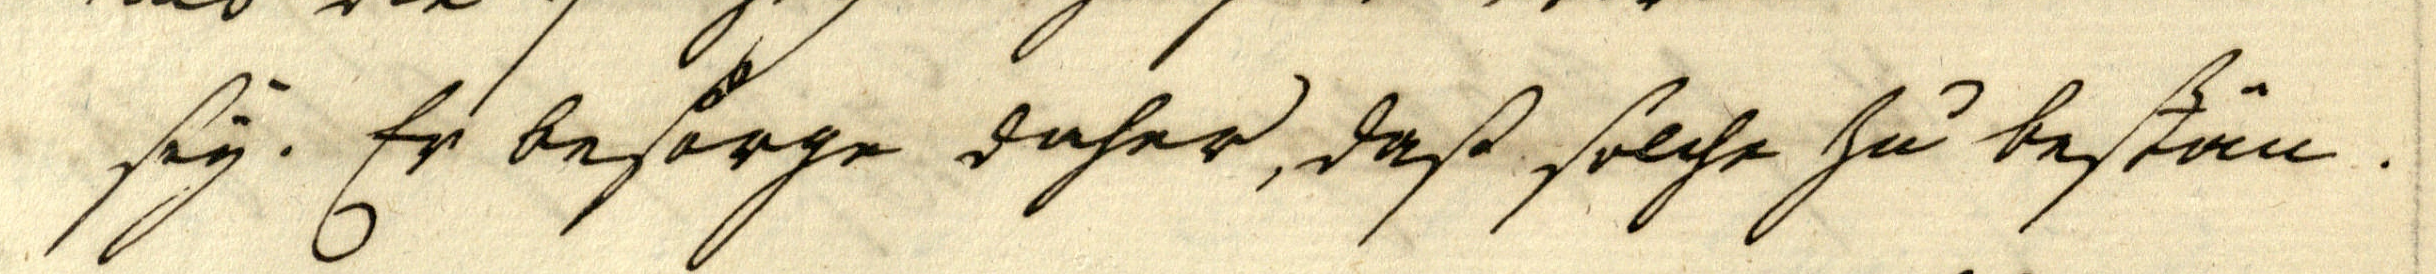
sey. Er besorge daher, daß solche zu bestän-
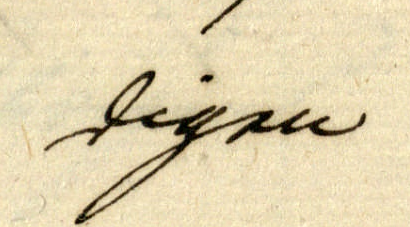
digen
